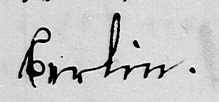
Berlin.
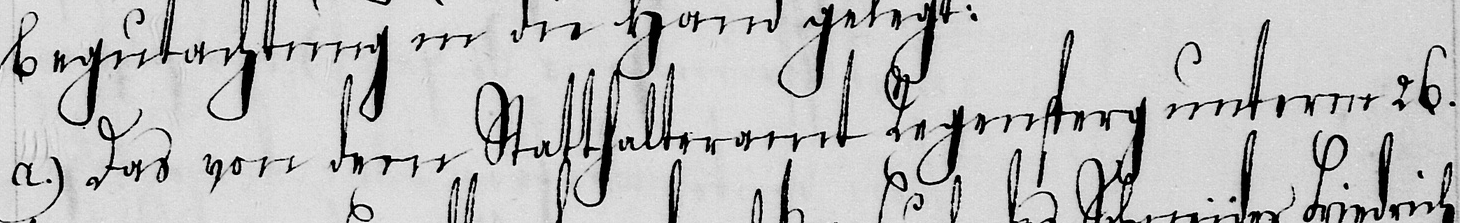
a.) Das von dem Statthalteramt Regensperg unterm 26.
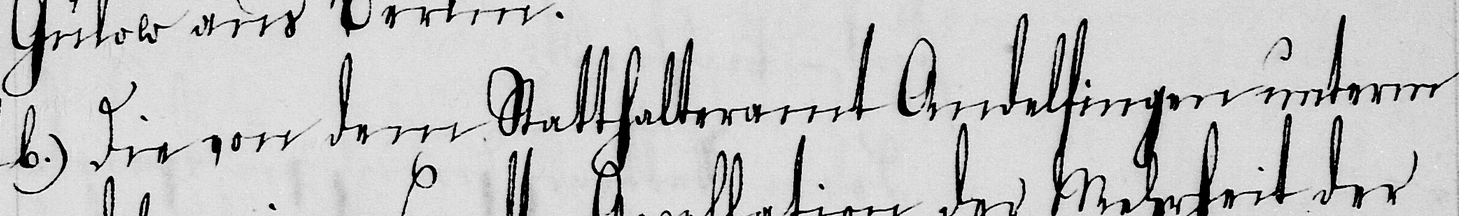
b.) Die von dem Statthalteramt Andelfingen unterm
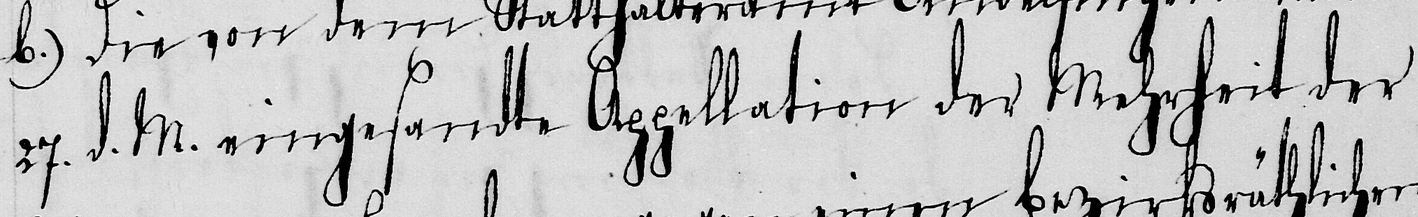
27. d. M. eingesandte Appellation der Mehrheit der
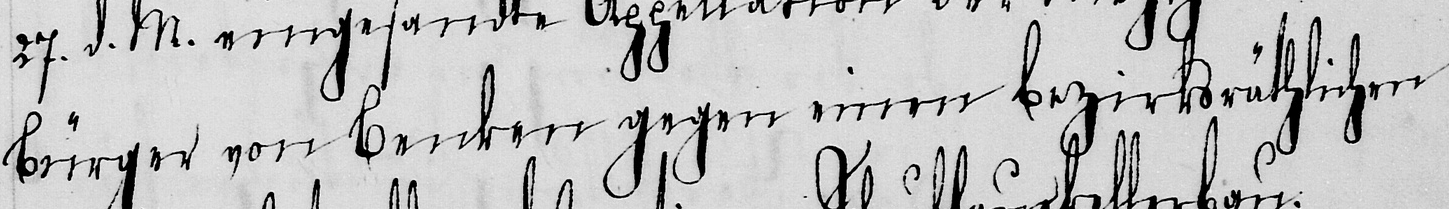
Bürger von Benken gegen einen bezirksräthlichen
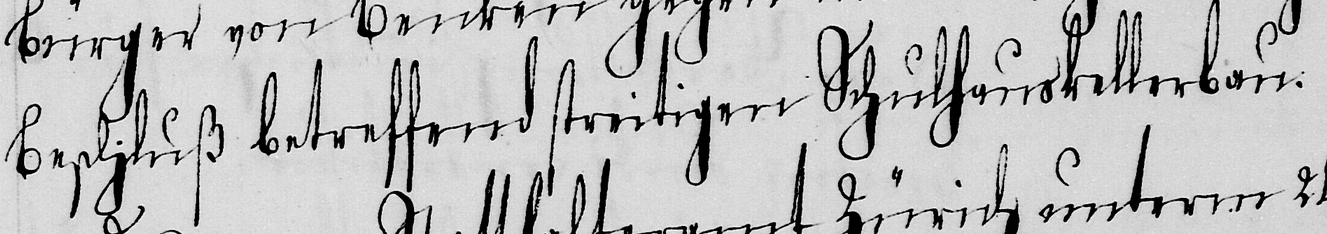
Beschluß betreffend streitigen Schulhauskellerbau.
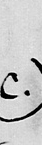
c.)
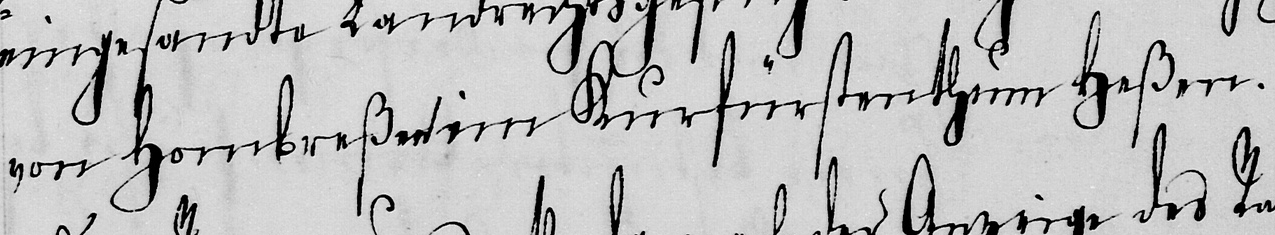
von Hombreßen im Kurfürstenthum Heßen.
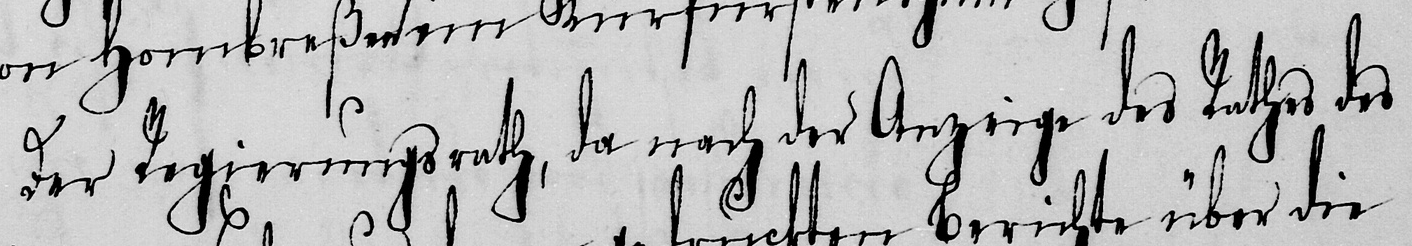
Der Regierungsrath, da nach der Anzeige des Rathes des
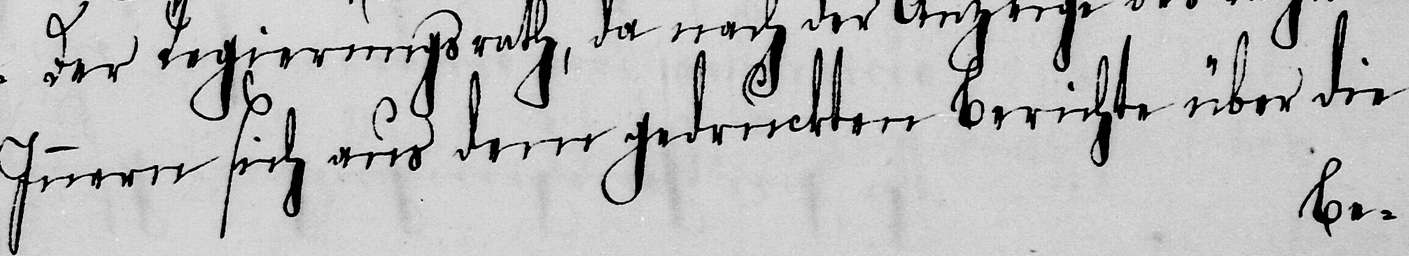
Innern sich aus dem gedruckten Berichte über die
